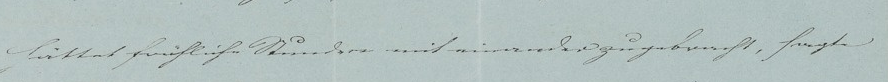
hättet fröhliche Stunden mit einander zugebracht, sagte
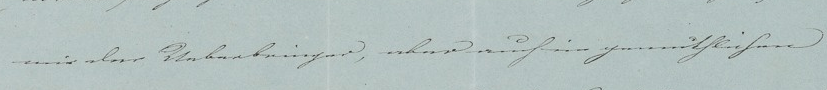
mir der Ueberbringer, aber auch im gemüthlichen
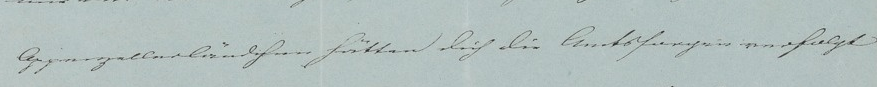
Appenzellerländchen hätten dich die Amtssorgen verfolgt
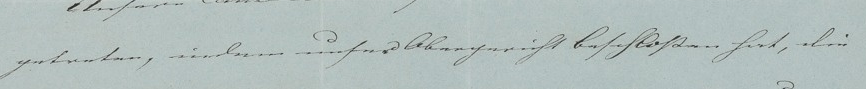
getreten, indem unser Obergericht beschloßen hat, die
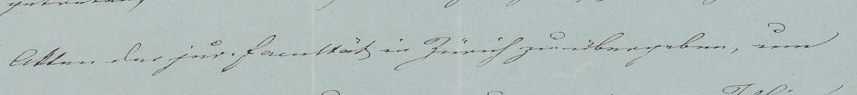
Akten der jur. Fakultät in Zürich zu übergeben, um
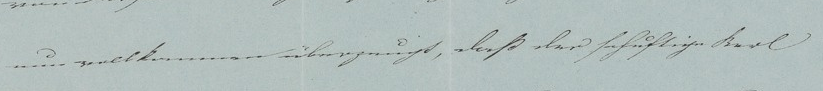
nun vollkommen überzeugt, daß der schuftige Kerl
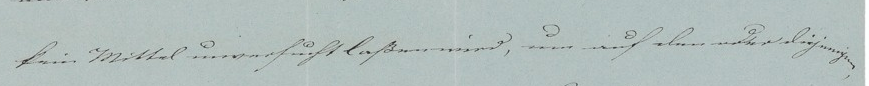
kein Mittel unversucht laßen wird, um auf den oder diejenigen,
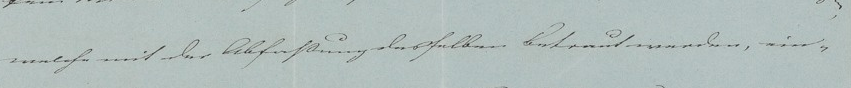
welche mit der Abfaßung desselben betraut werden, ein-
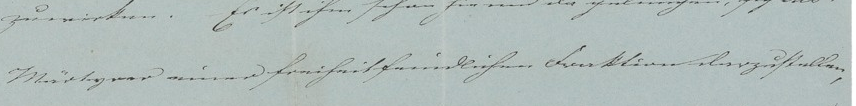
Märtyrer einer freiheitfeindlichen Fraktion darzustellen,
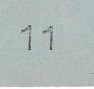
der
